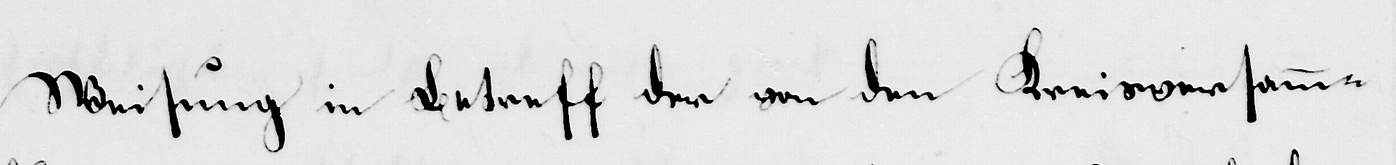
Weisung in Betreff der von den Kreisversamm¬
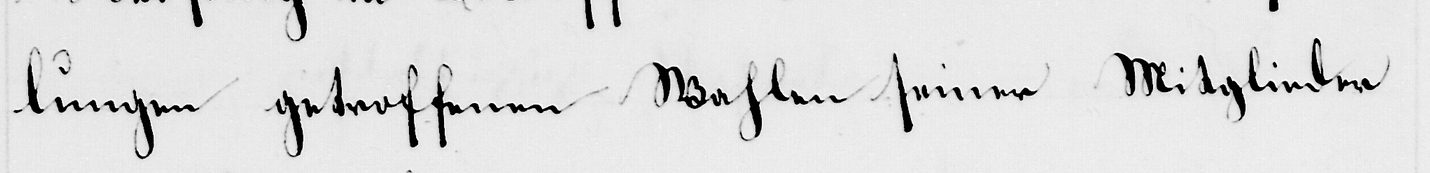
lungen getroffenen Wahlen seiner Mitglieder
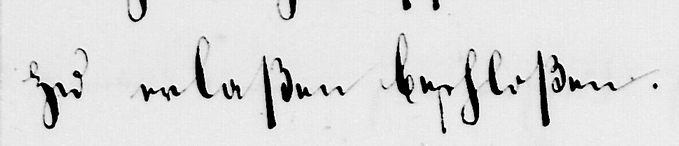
zu erlaßen beschloßen.
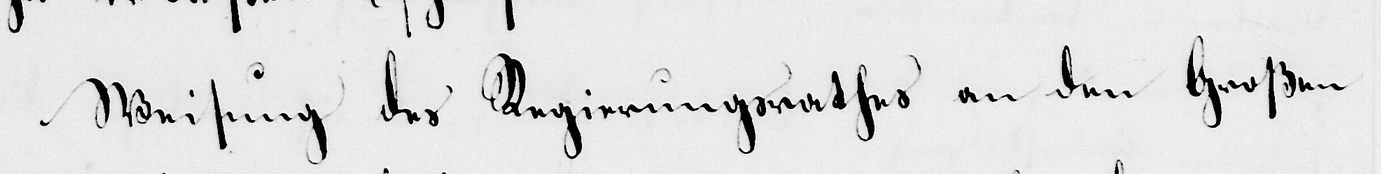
Weisung des Regierungsrathes an den Großen
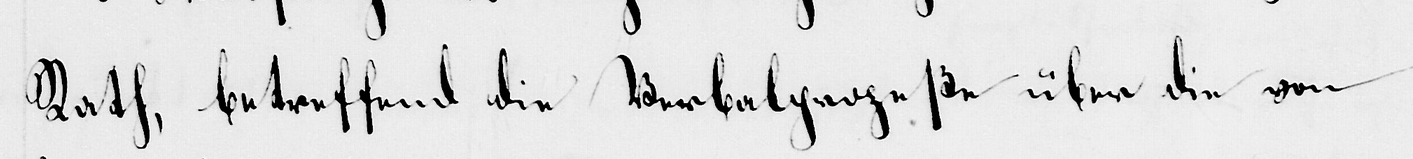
Rath, betreffend die Verbalprozeße über die von
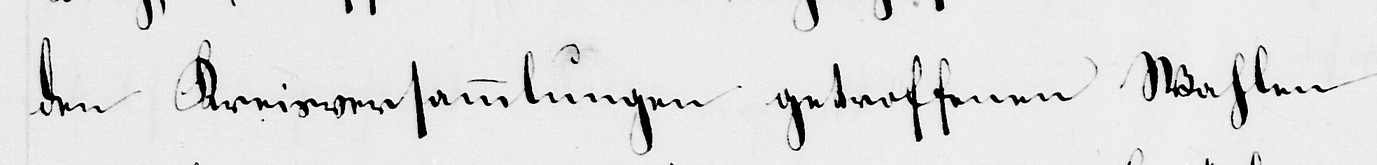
den Kreisversammlungen getroffenen Wahlen
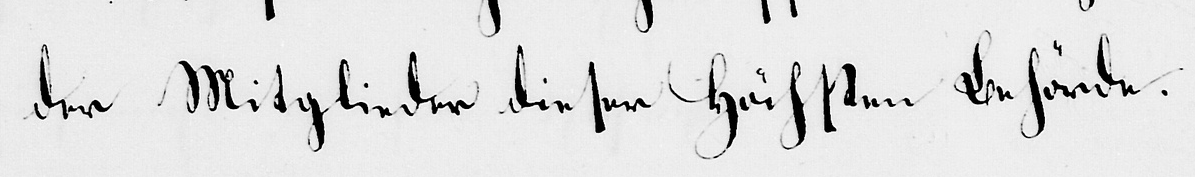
der Mitglieder dieser Höchsten Behörde.
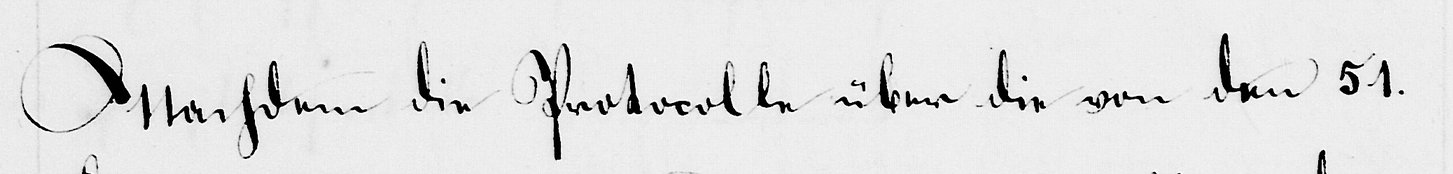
Nachdem die Protocolle über die von den 51.
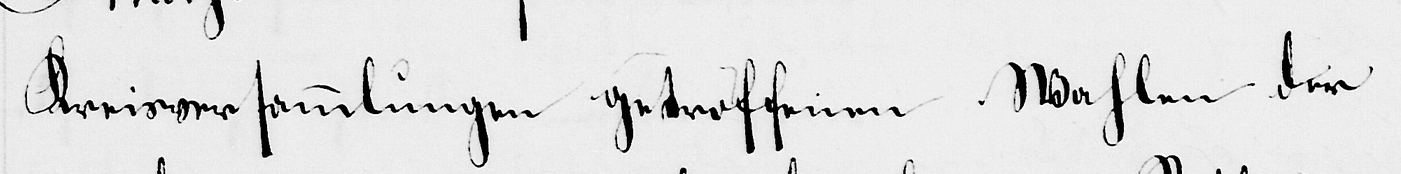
Kreisversammlungen getroffenen Wahlen der
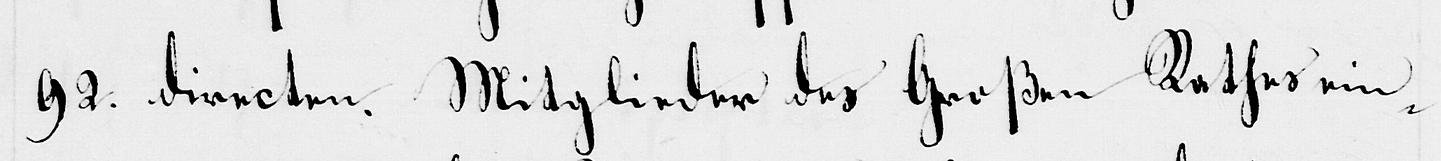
92. directen Mitglieder des Großen Rathes ein¬
